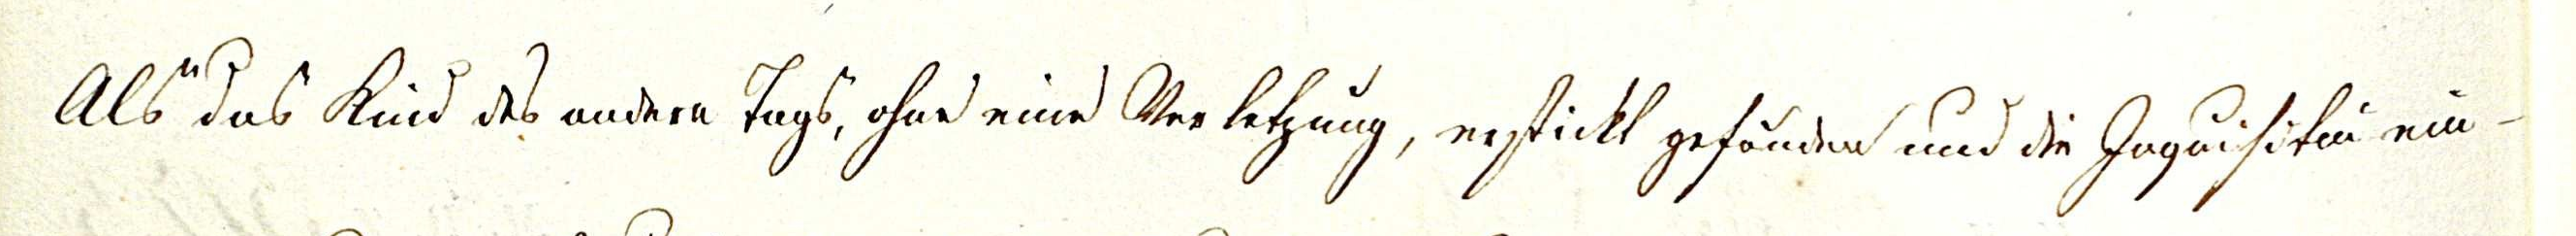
Als das Kind des andern Tags, ohne eine Verletzung, erstickt gefanden und die Inquisitin ein¬
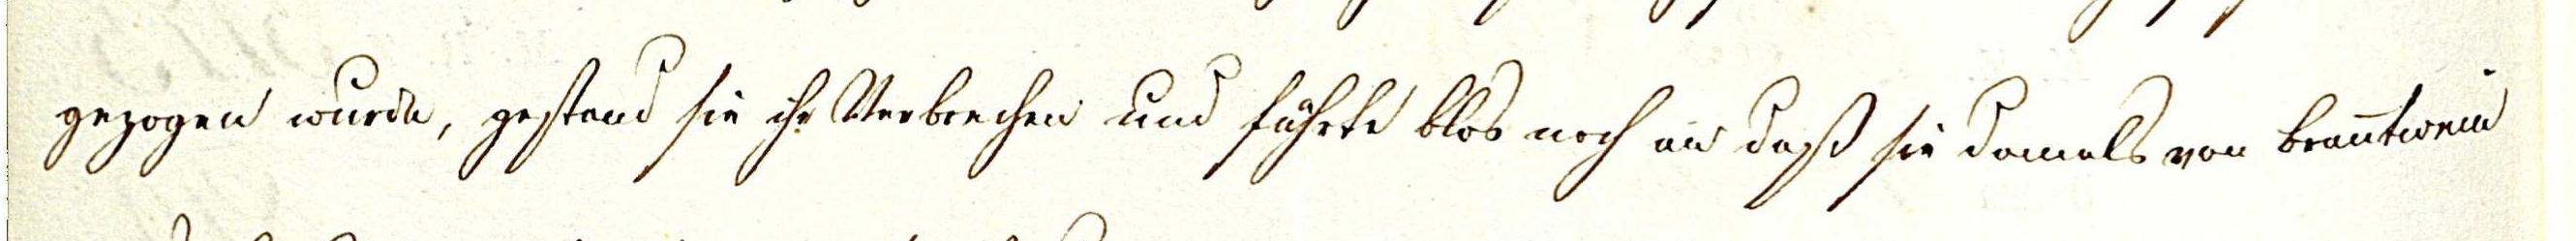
gezogen wurde, gestand sie ihr Verbrechen und führte blos noch an daß sie damals von Branntwein
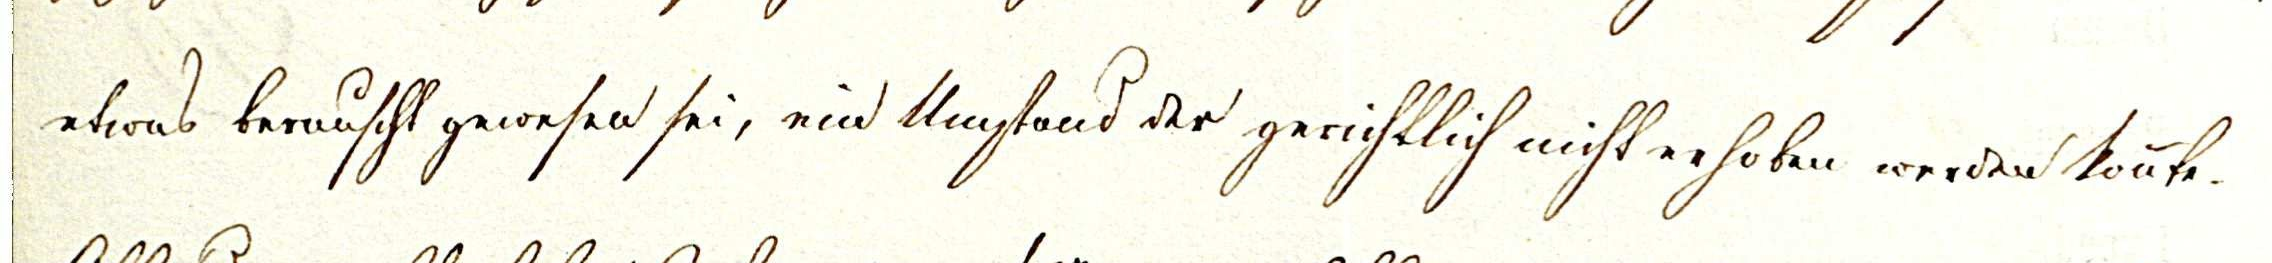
etwas berauscht gewesen sei, ein Umstand der gerichtlich nicht erhoben warden konnte.
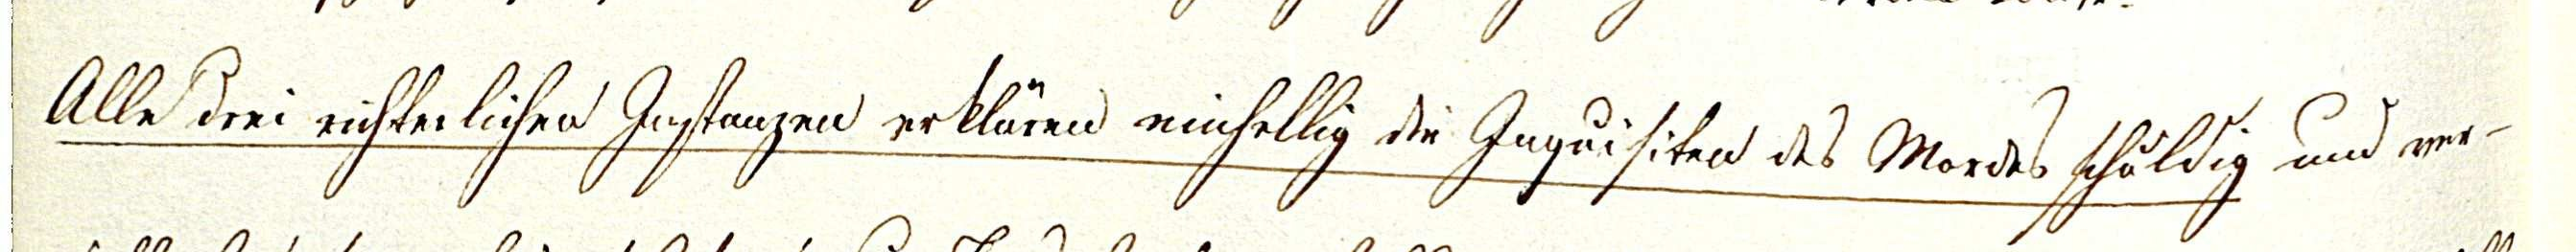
Alle drei richterlichen Instanzen erklären einhellig die Inquisitin des Mordes schuldig und ver¬
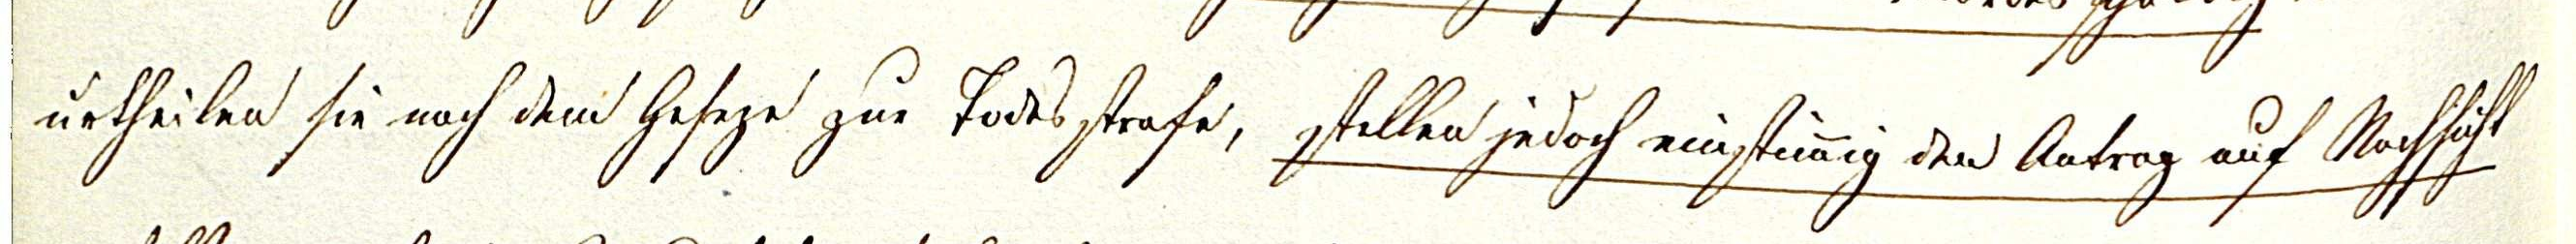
urtheilen sie nach dem Geseze zur Todesstrafe, stellen jedoch einstimmig den Antrag auf Nachischt
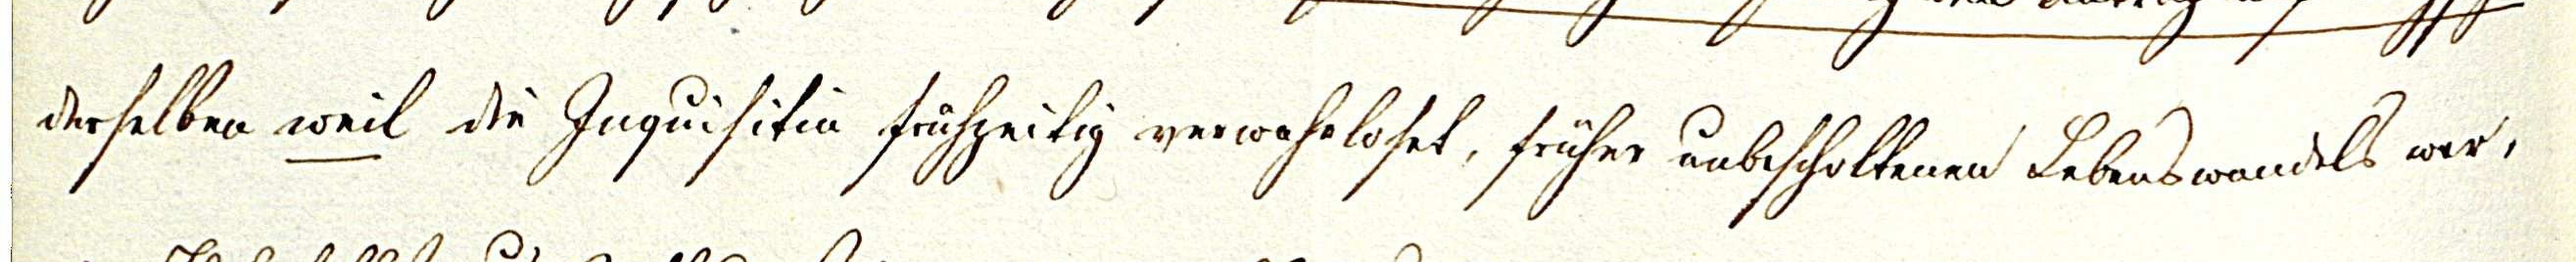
derselben weil die Inquisitin frühzeitig verwahroset, früher unbescholtenen Lebenswandel war,
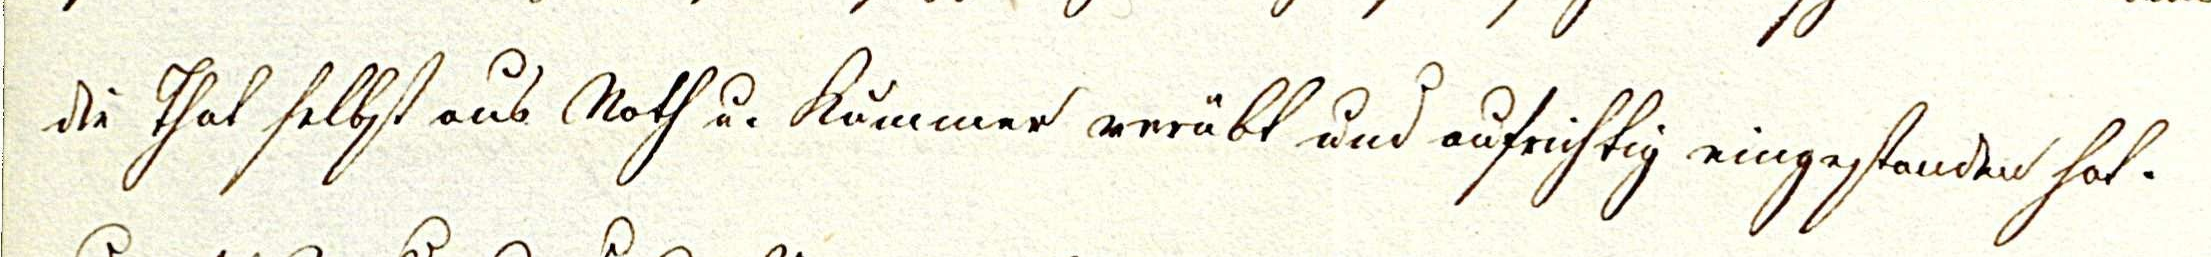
die That selbst aus Noth u. Kummer verübt und aufrichtig eingestanden hat.
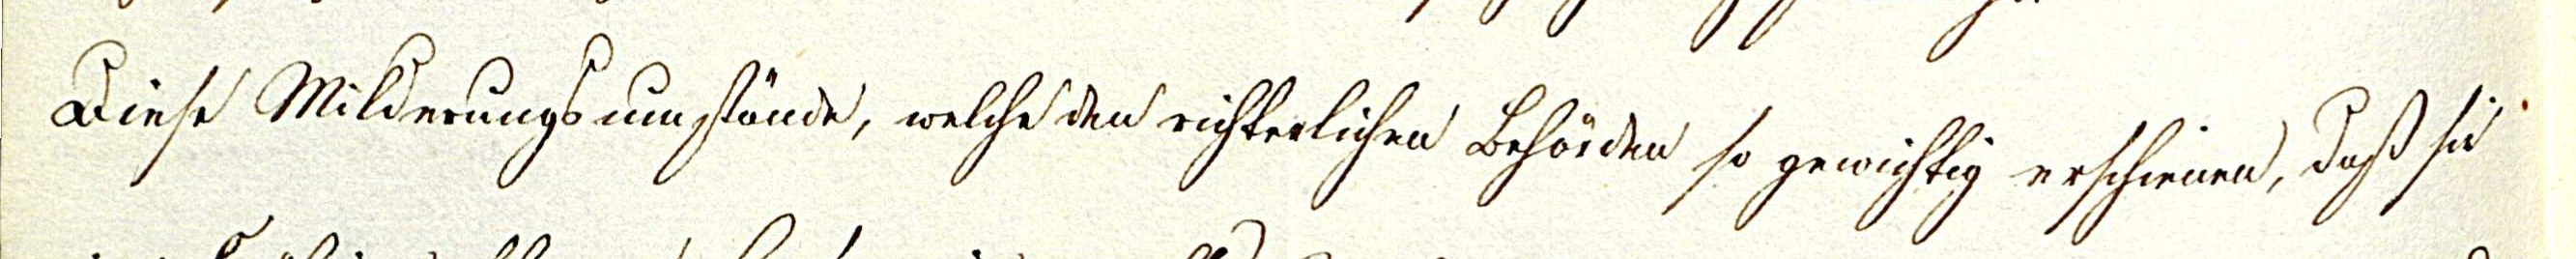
Diese Milderungsumstände, welche den richterlichen Behörden so gewichtig erscheinen, daß sie
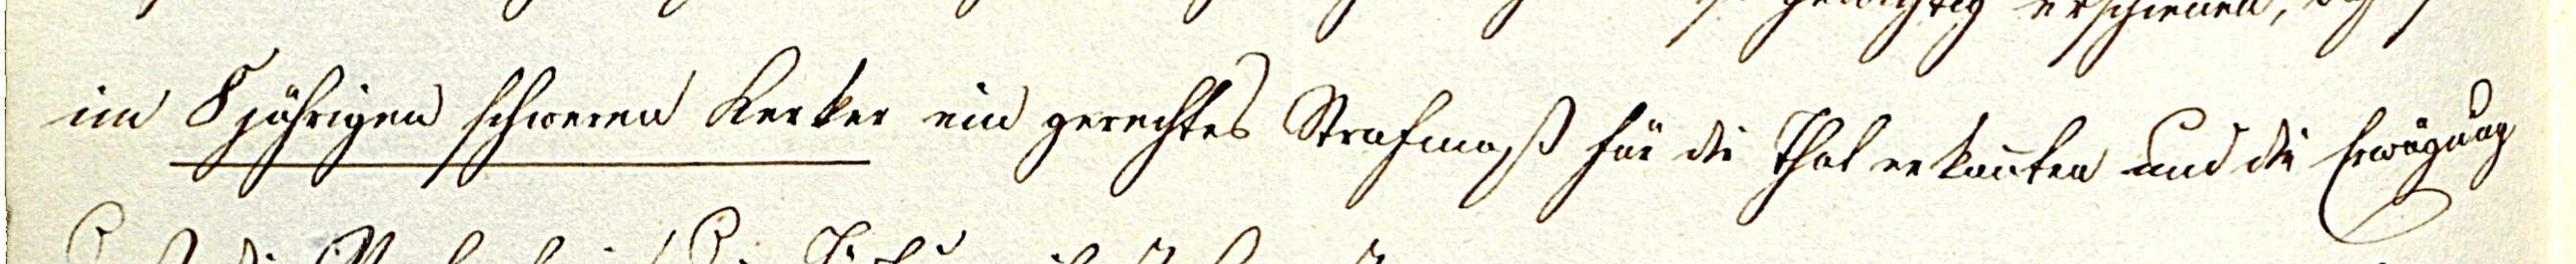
ein 8jährigen schweren Kerker ein gerechtes Strafmaß für die That erkannten und die Erwägung
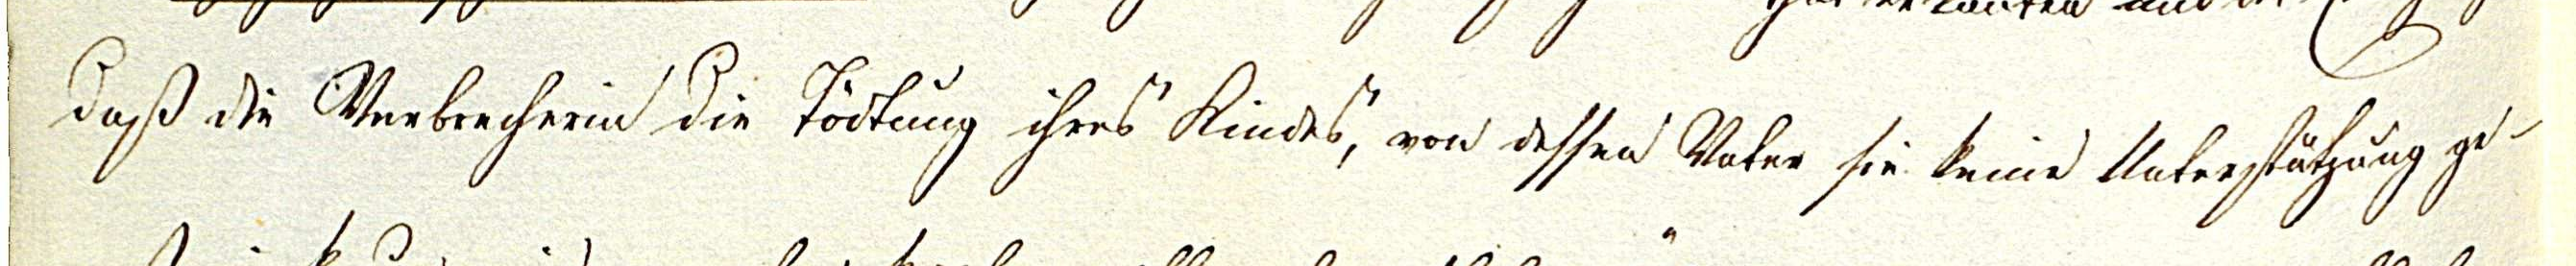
daß die Verbrecherin die Tödtung ihres Kindes, von dessen Vater sie keine Unterstützung ge¬
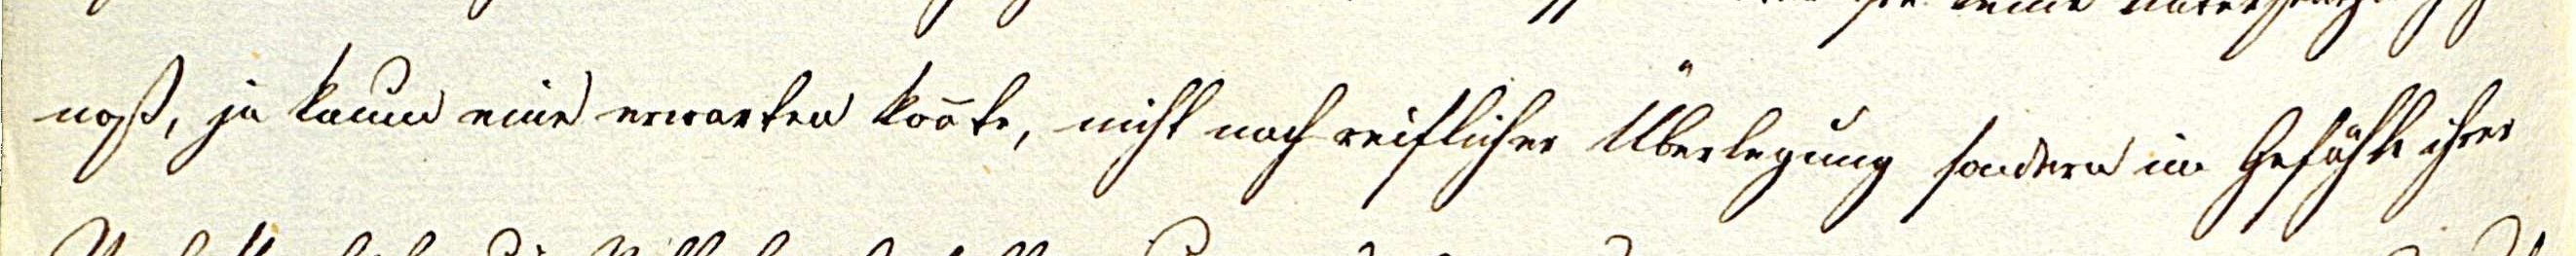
noß, ja kaum eine erwarten konnte, nicht noch reiflicher Überlegung sondern im Gefühle ihrer
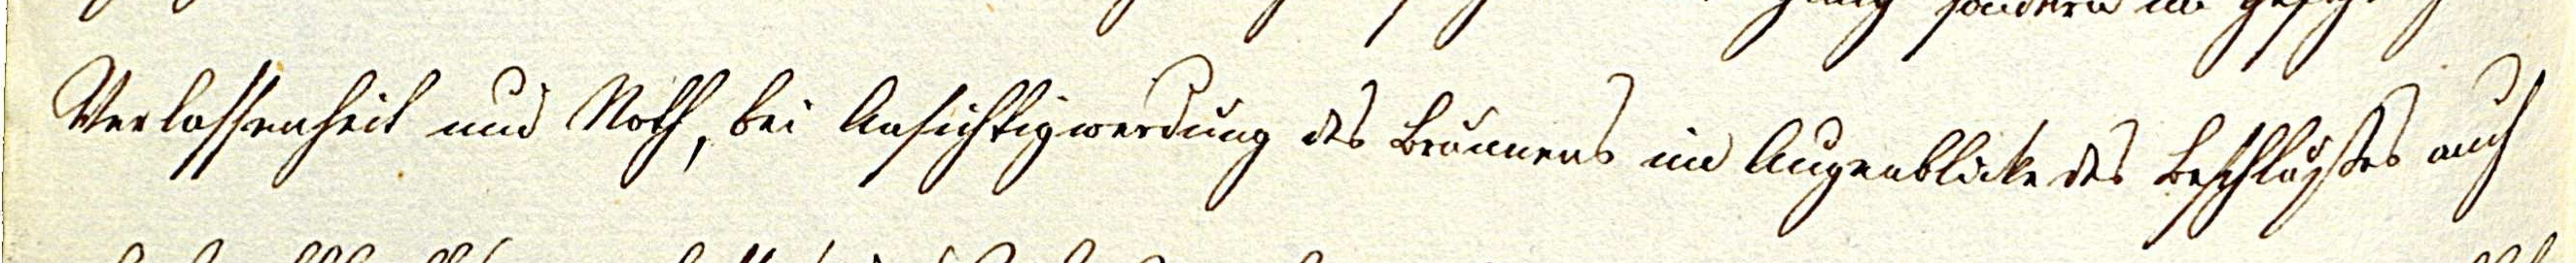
Verlassenheit und Noth, bie Ansichtigwerdung des Brunnens in Augenblicke des Beschlußes auch
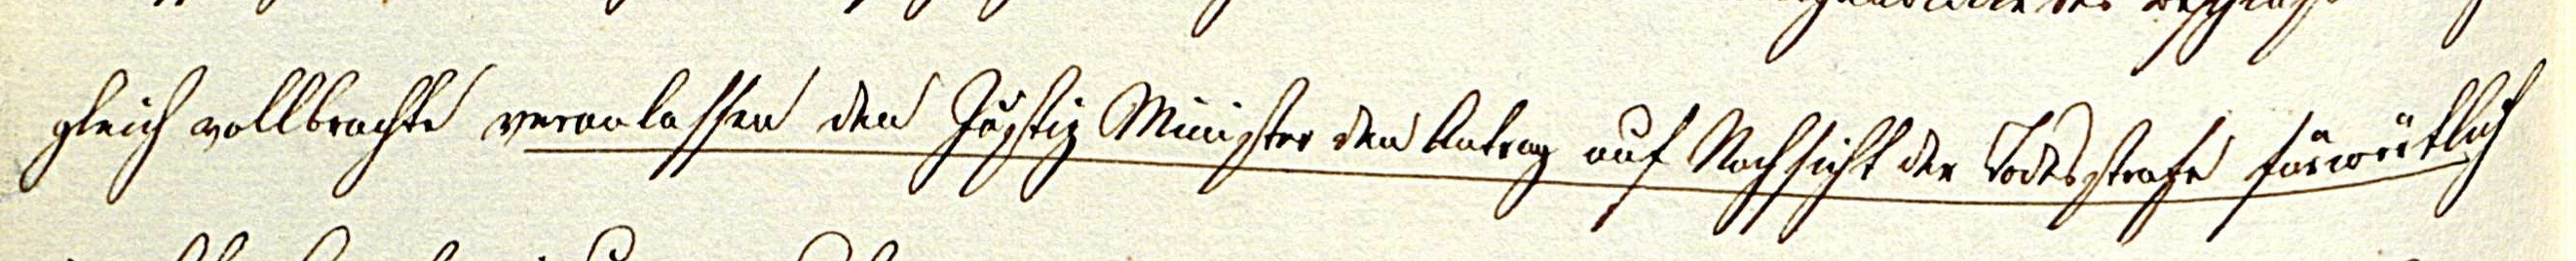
gleich vollbrachte veranlassen den Justiz Minister den Antrag auf Nachsicht der Todesstrafe fürwütlich
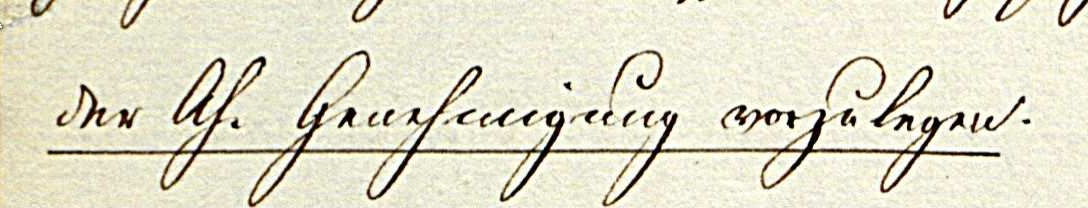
der Ah. Genehmigung vorzulegen.
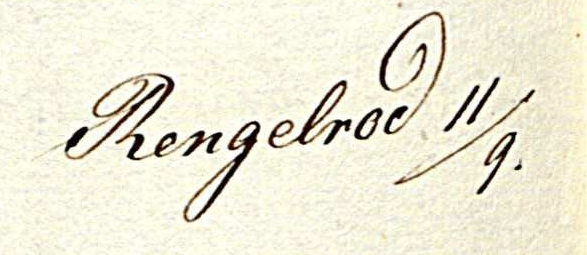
Rengelrod 11/9
